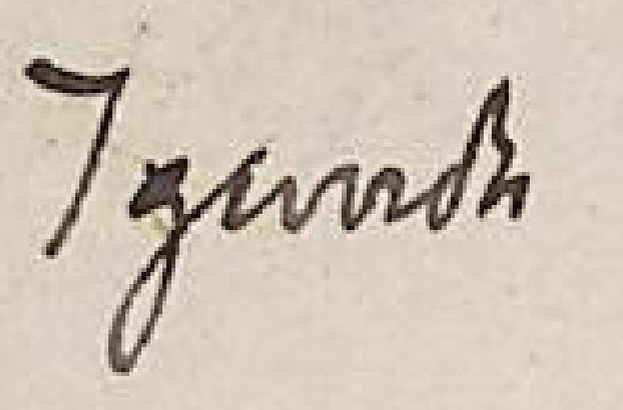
] gerade
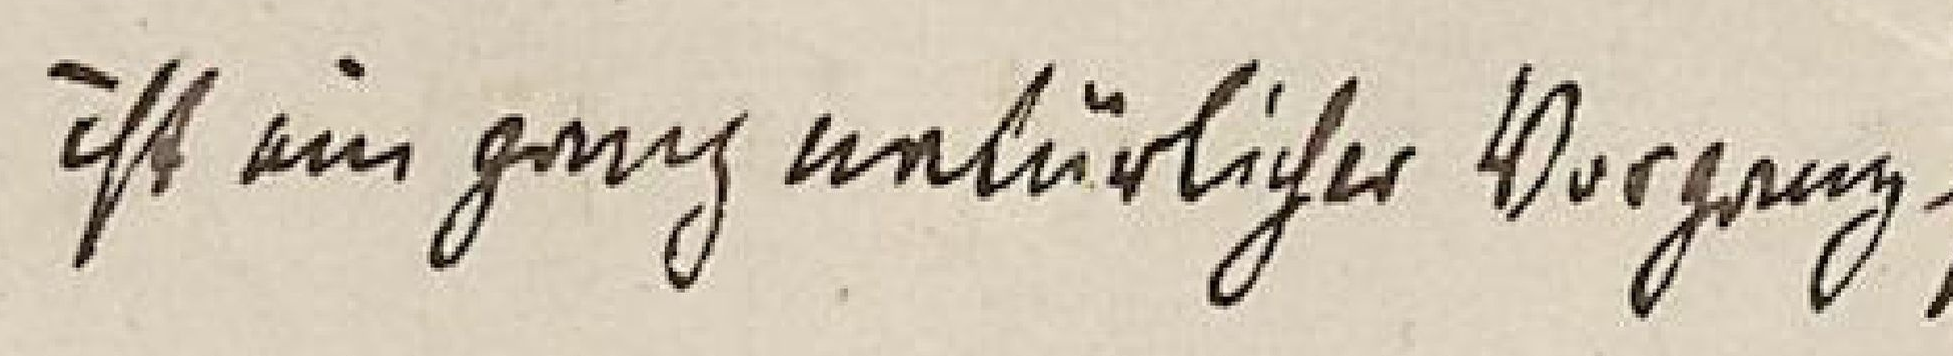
ist ein ganz natürlicher Vorgang
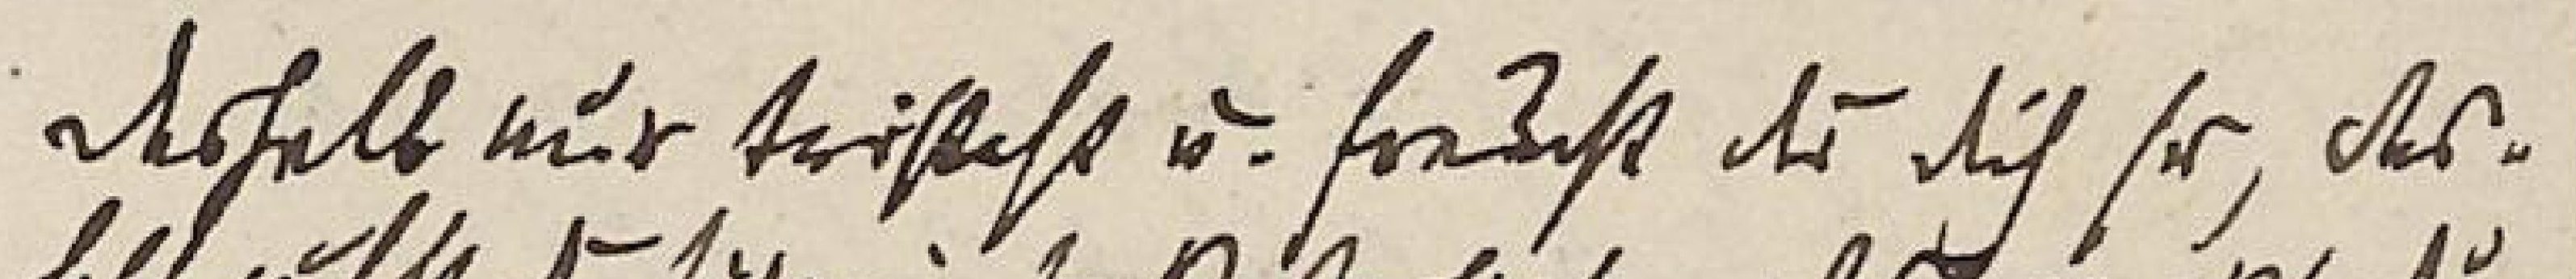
Deshalb nur tröstest u. feust du dich sr, des¬
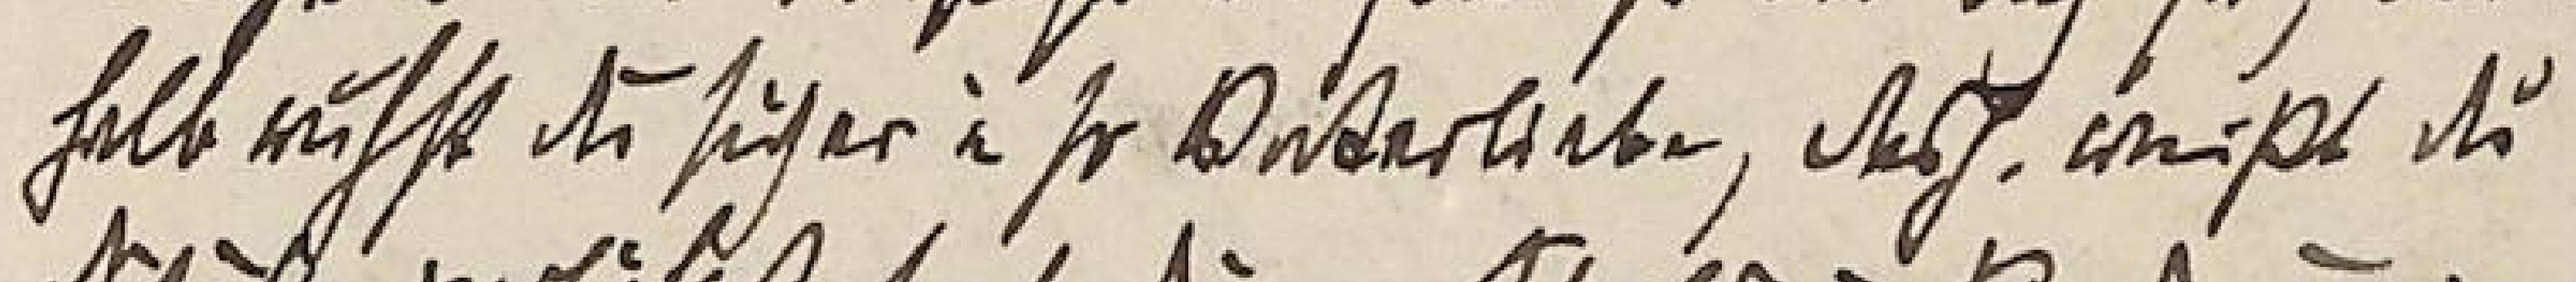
halb ruhst du sicher in sr Vaterliebe, desh. weißt du
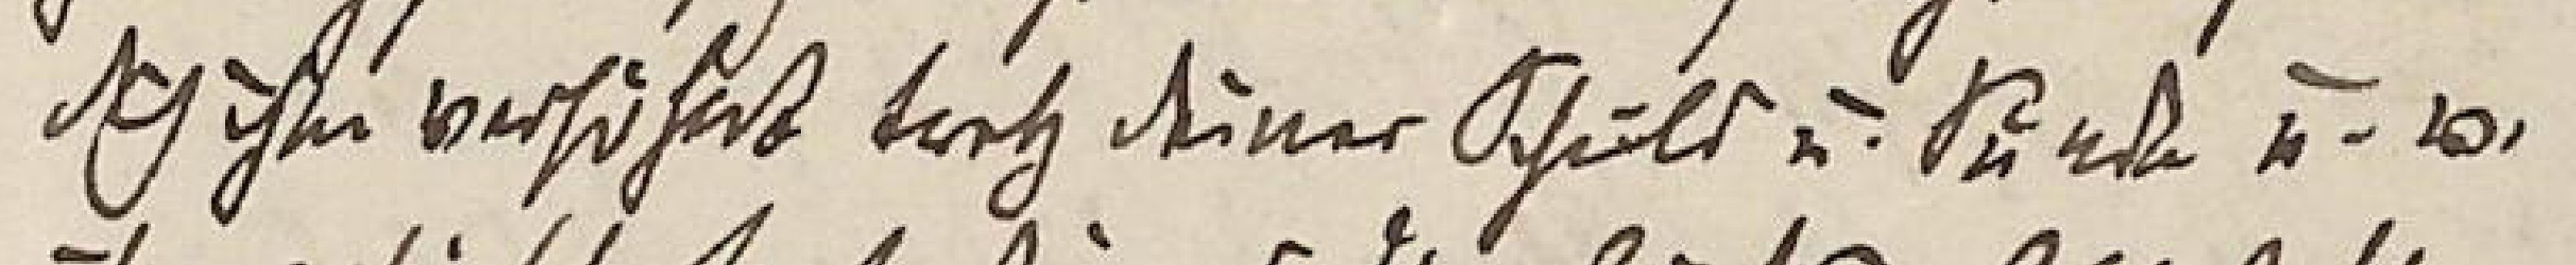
dich ihm versöhnet trotz deiner Schuld u. Sünde u. v.
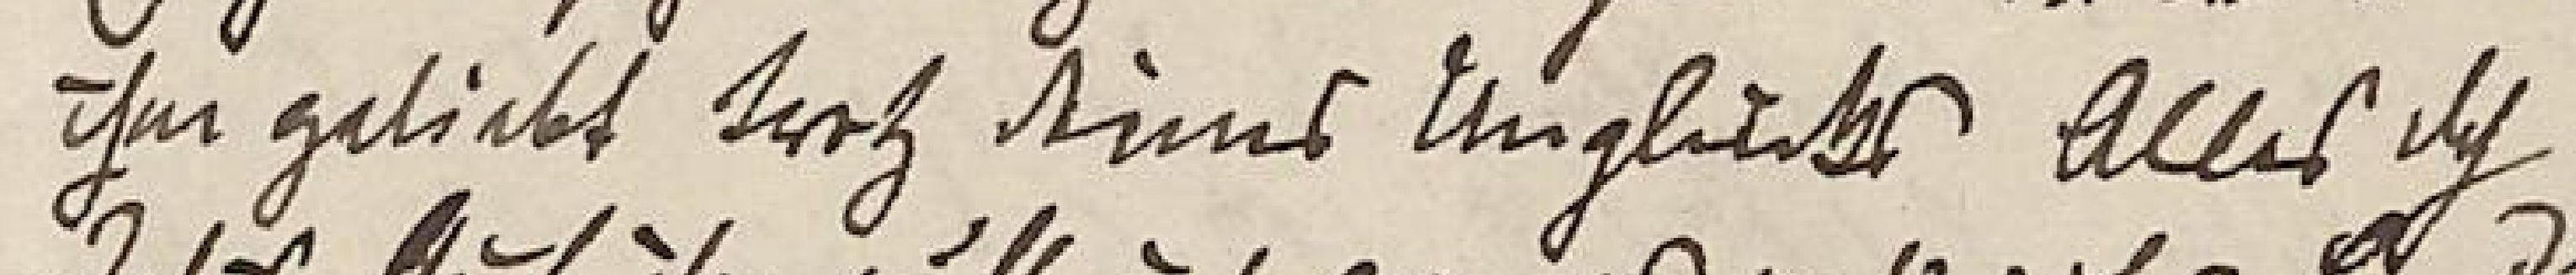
ihm geliebt trotz deines Unglücks Alles dch
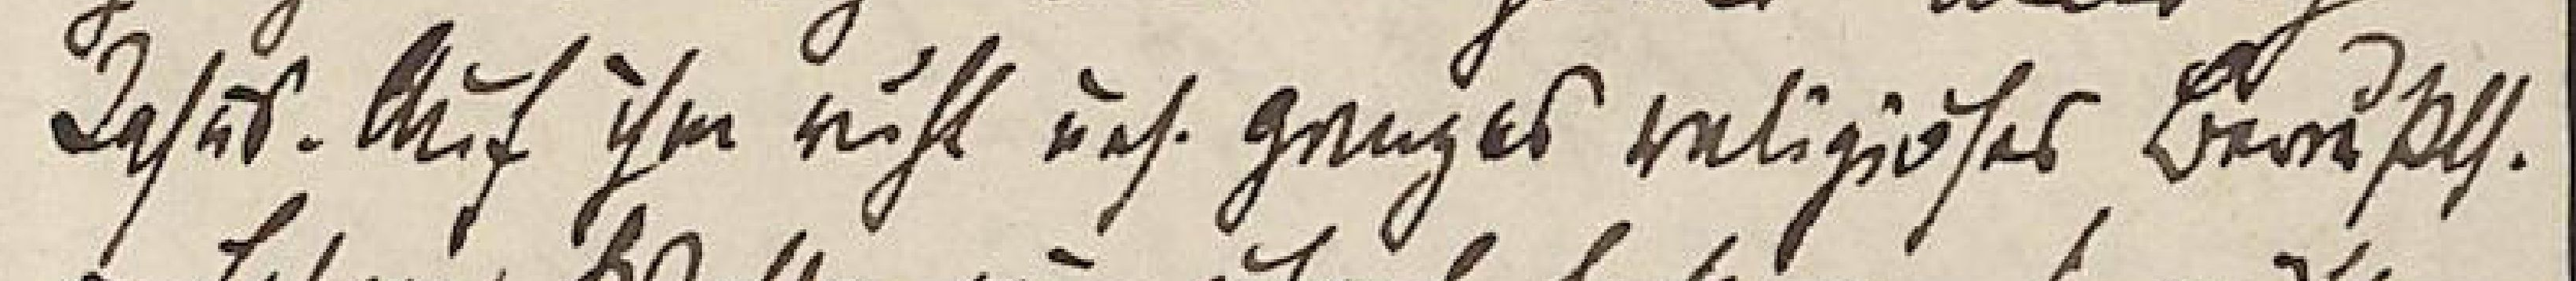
Jesus. Auf ihm ruht uns. ganzes religiöses Bewußts.
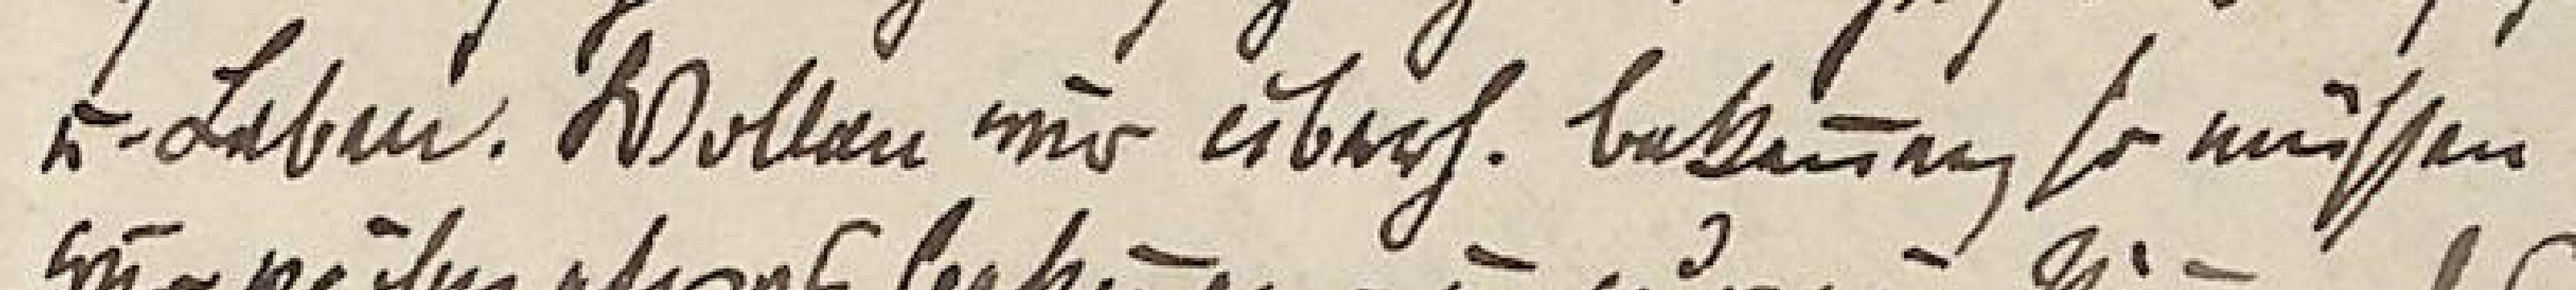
u. Leben. Wollen wir überh. bekenen, so müssen
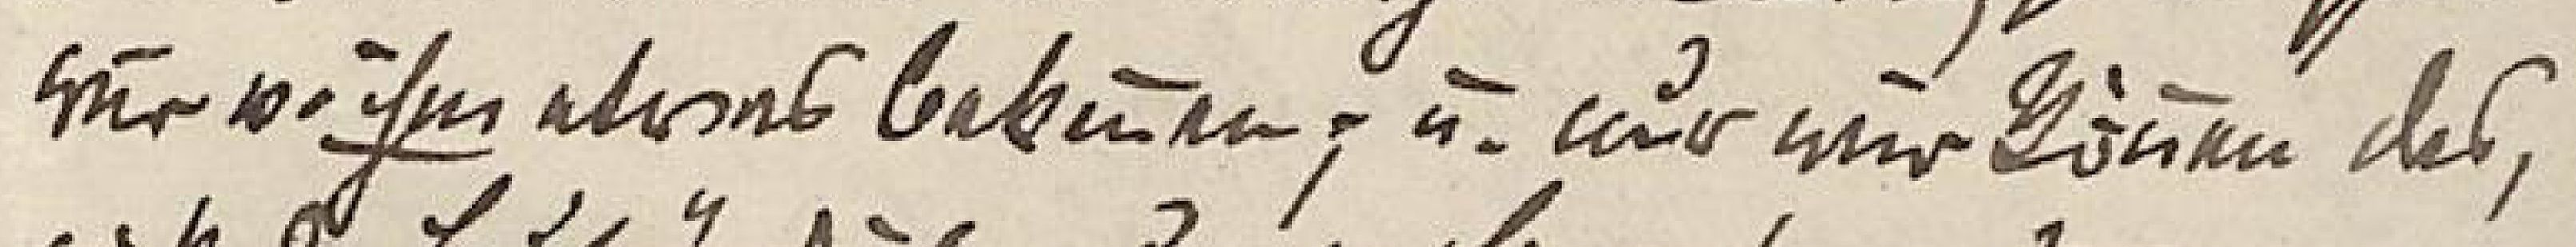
wir v. ihm etwas bekenen; u. nur wir können das,
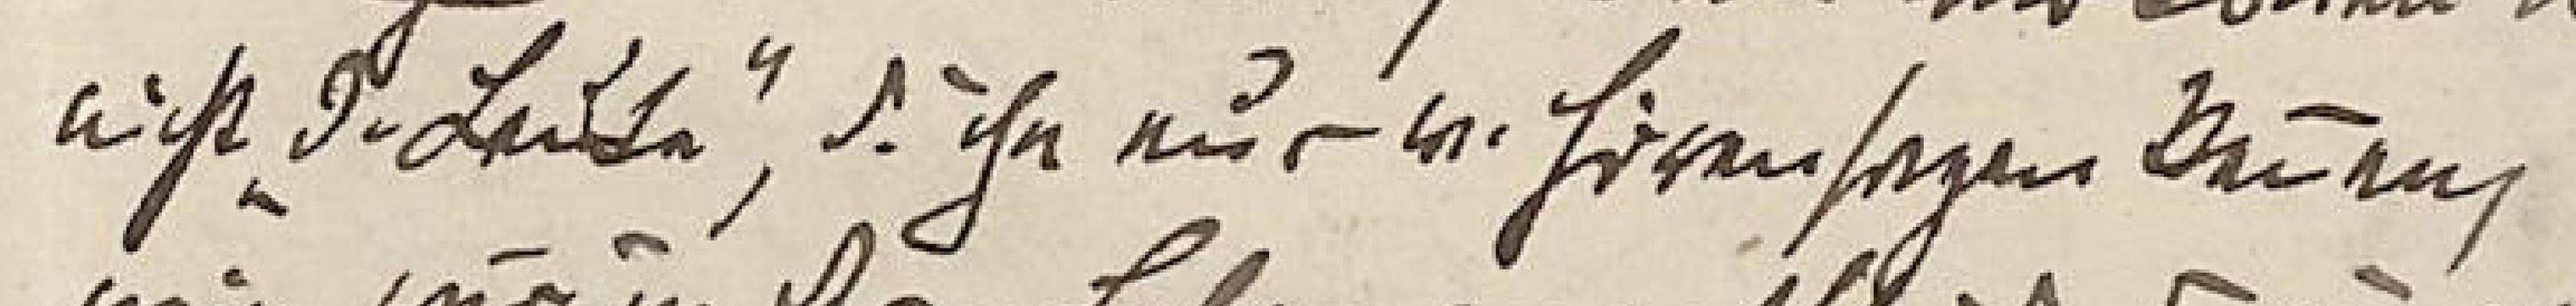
nicht "d. Leute", d. ihn nur v. hörensagen kenen,
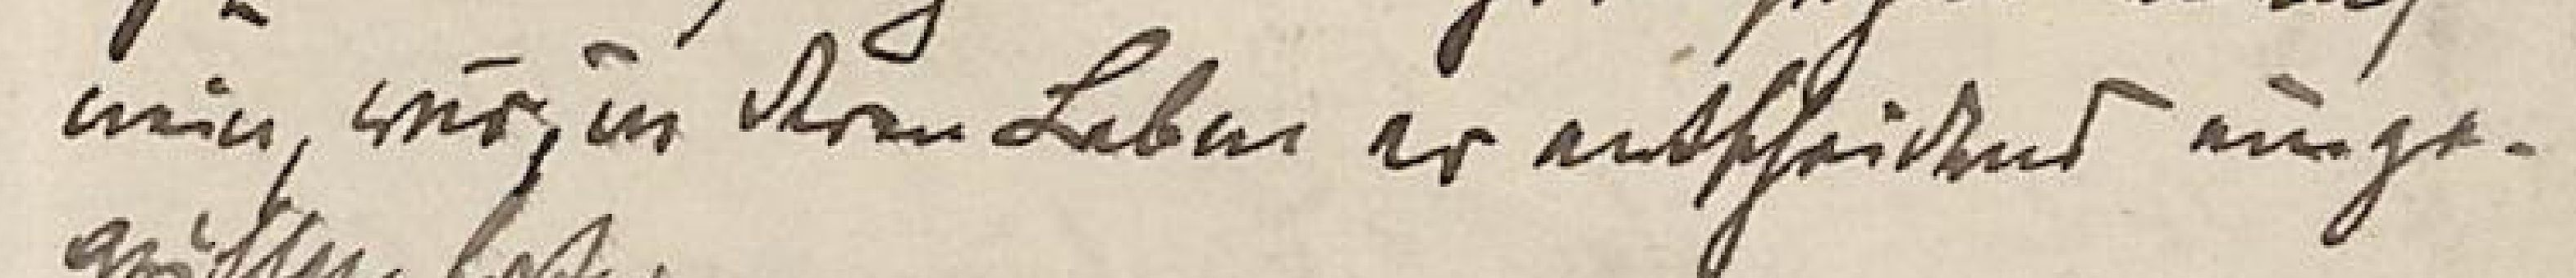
nein, wir, in deren Leben er entscheiden einge¬
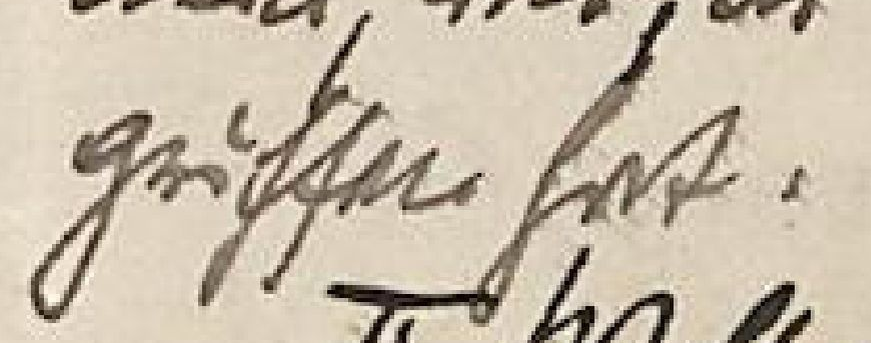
griffen hat.
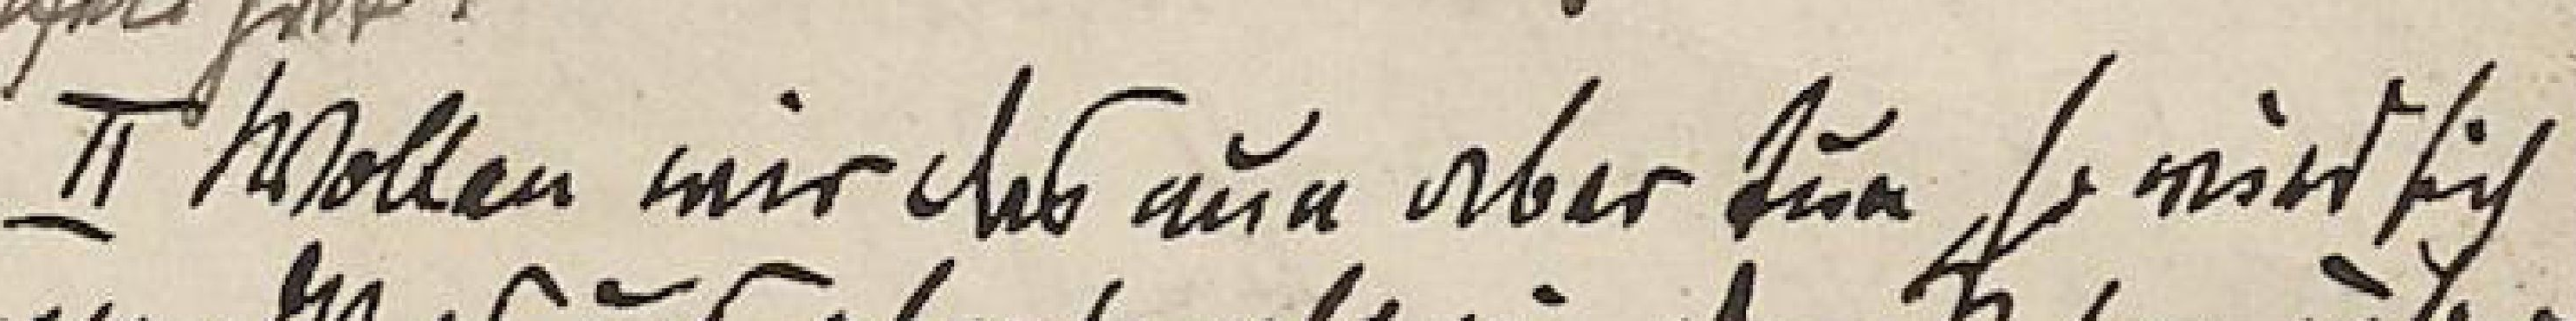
II. Wollen wir das nun aber tun, so wird sich
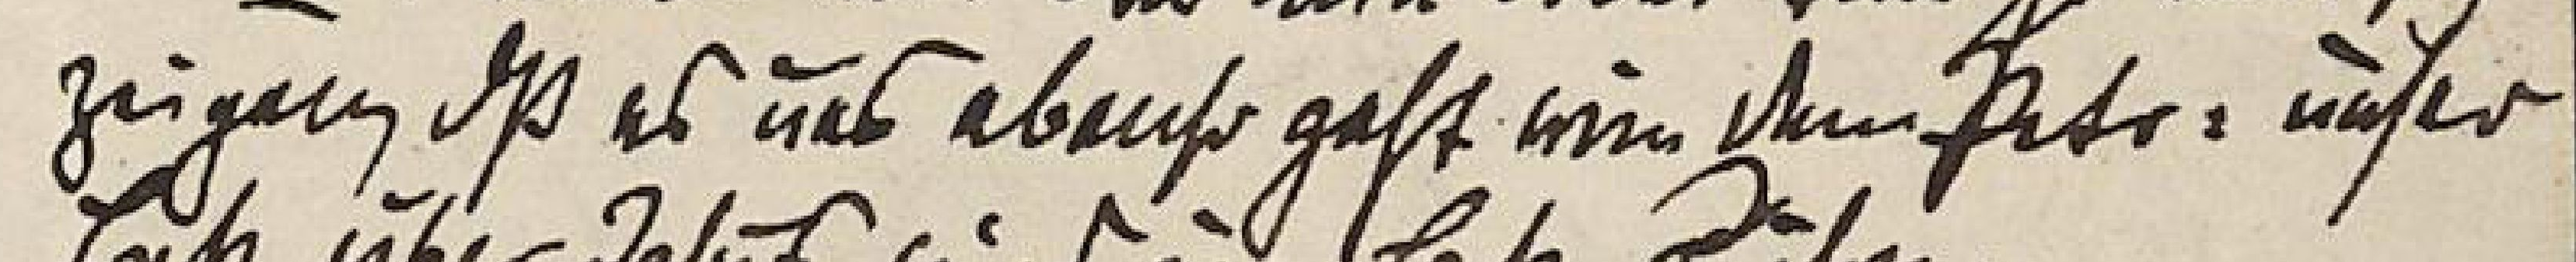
zeigen, daß es uns ebenso geht wie dem Petr: unser
